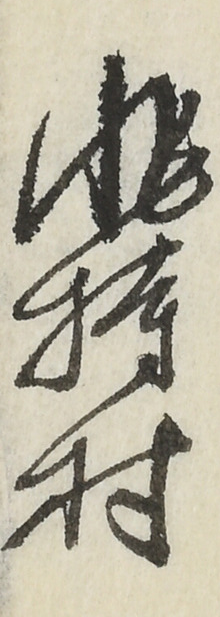非持村

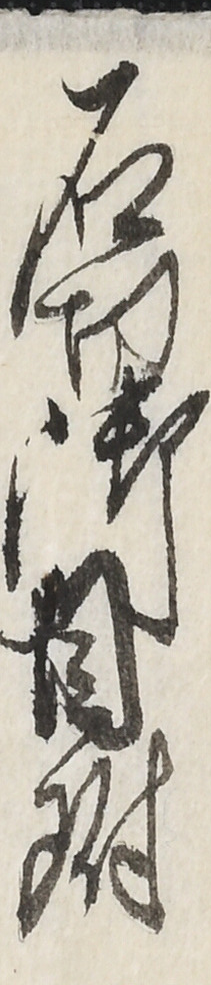石切御目附
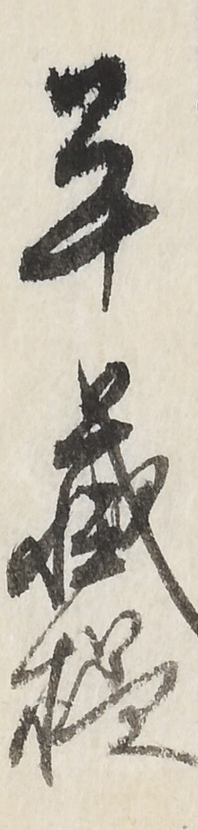平蔵様
